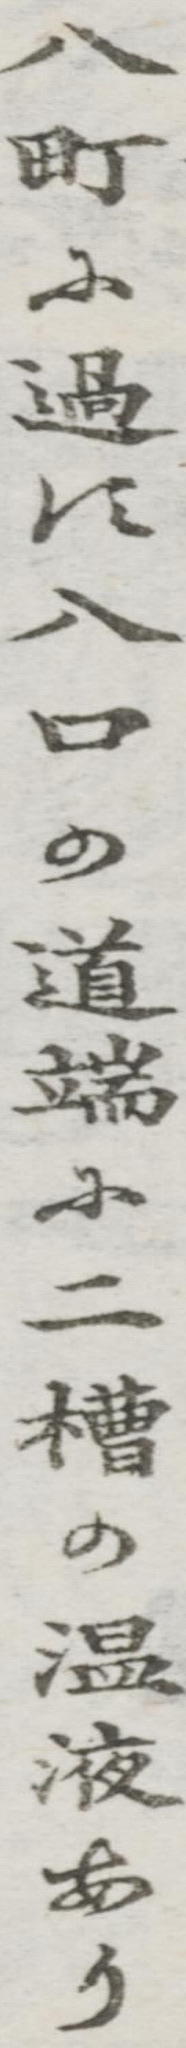八町に過す入口の道端に二槽の温液あり
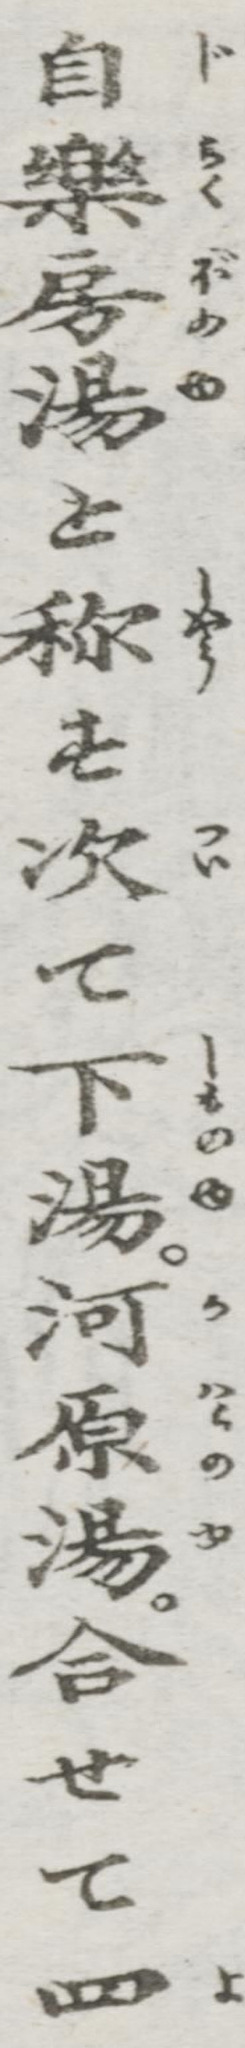自楽房湯を称す次て下湯。河原湯。合せて四
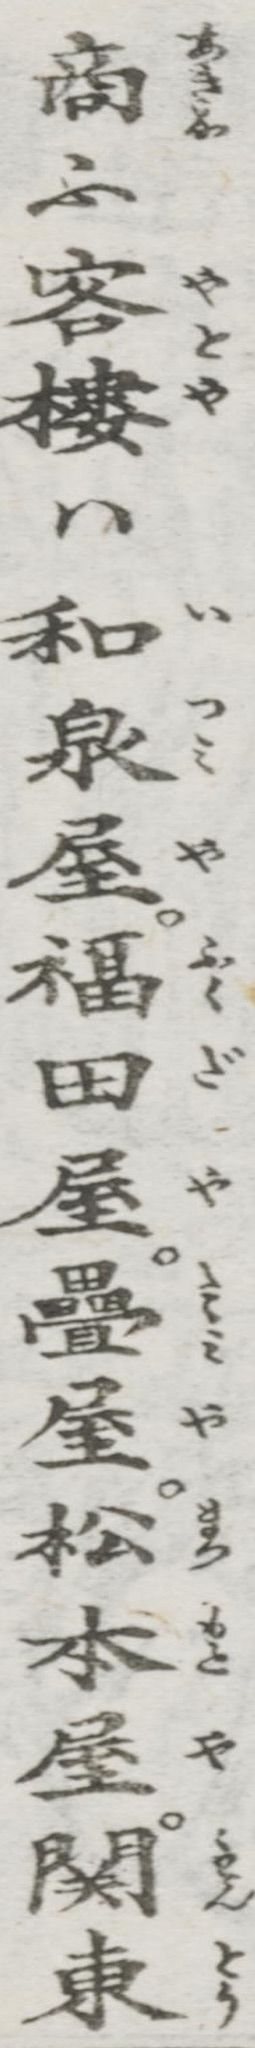商ふ客樓は和泉屋。福田屋。畳屋。松本屋。関東
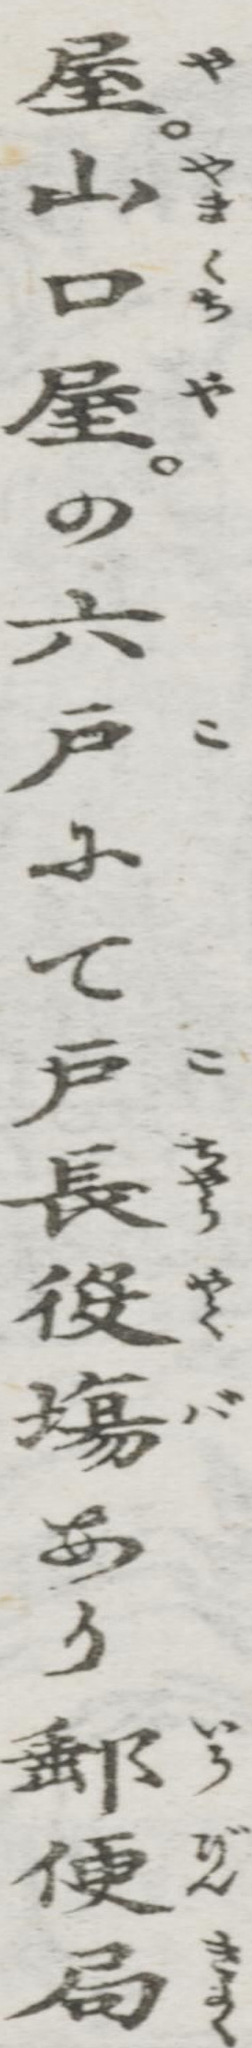屋。山口屋。の六戸にて戸長役場あり郵便局
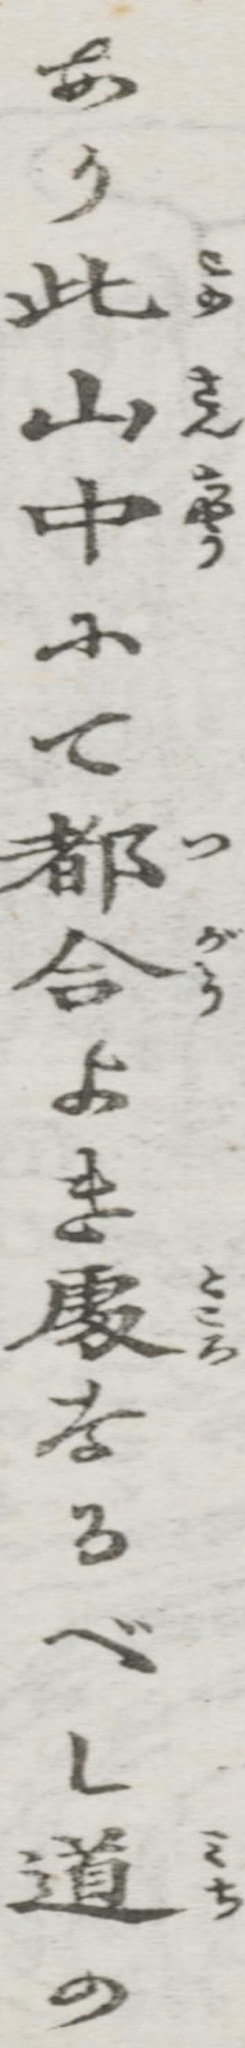あり此山中にて都合よき處なるべし道の
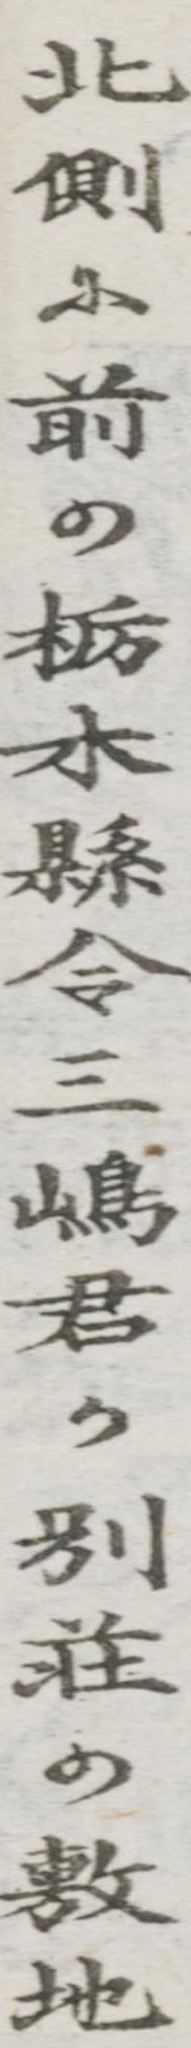北側に前の栃木縣令三嶋君か別荘の敷地
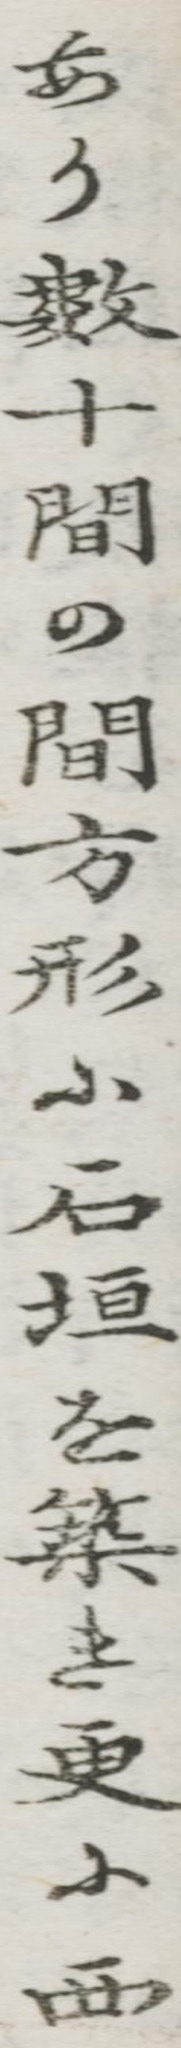あり数十間の間方形に石垣を築き更に西
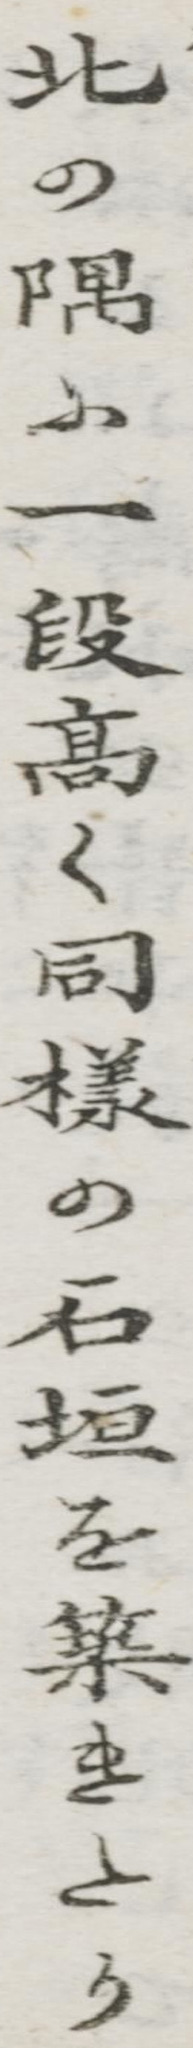北の隅に一段高く同様の石垣を築きたり
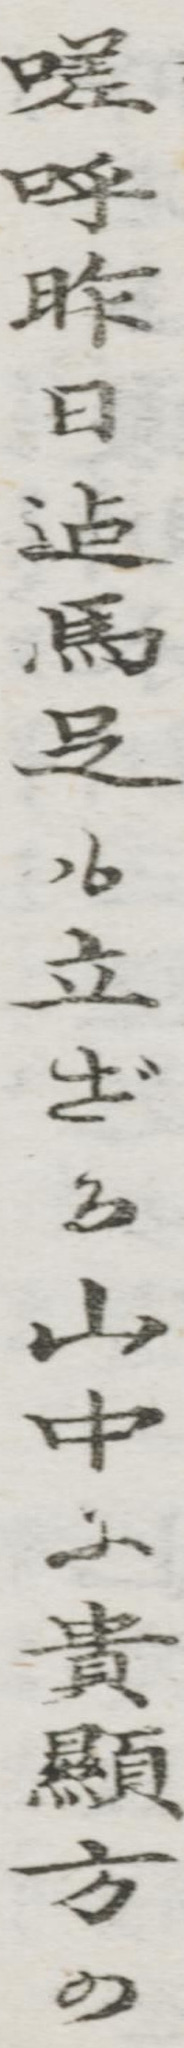嗚呼昨日迠馬足も立ざる山中に貴顕方の
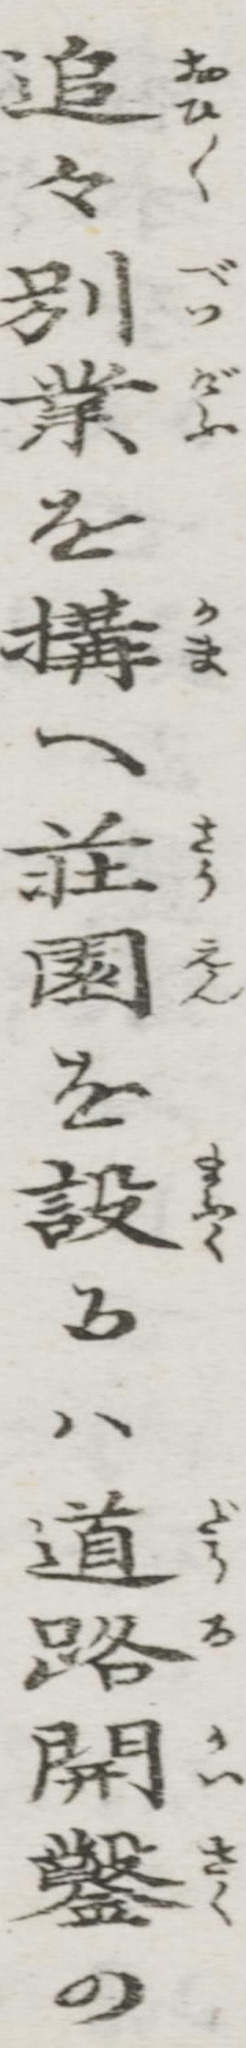追々別業を構へ荘園を設るは道路開鑿の
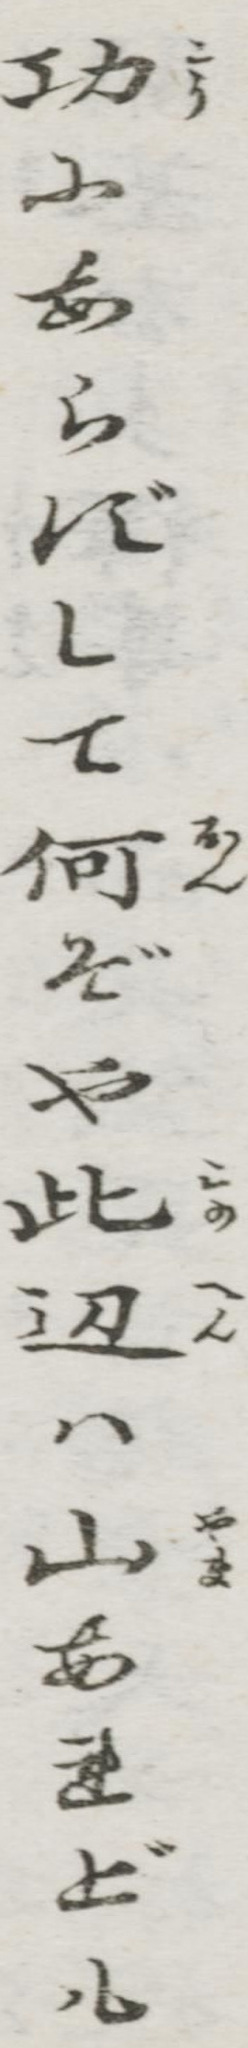功にあらずして何ぞや此辺は山あれども
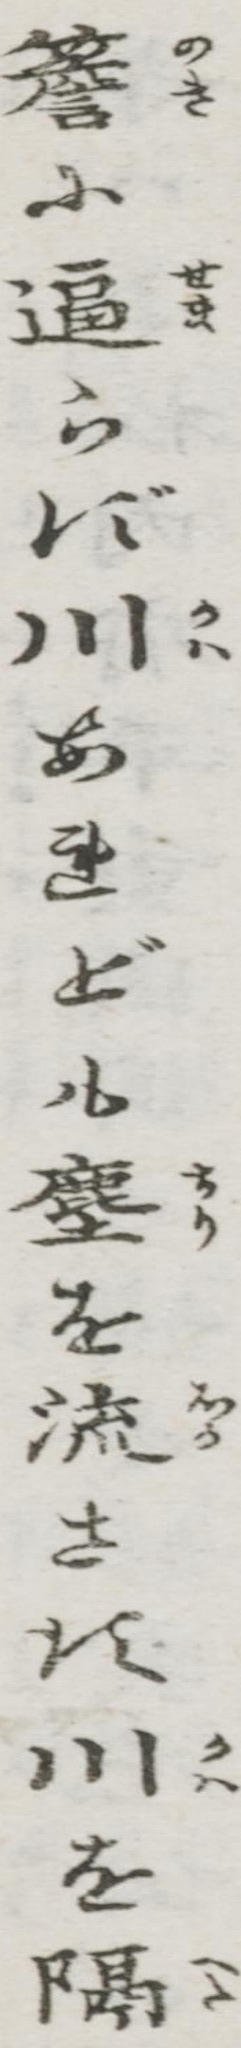簷に逼らず川あれども塵を流さす川を隔
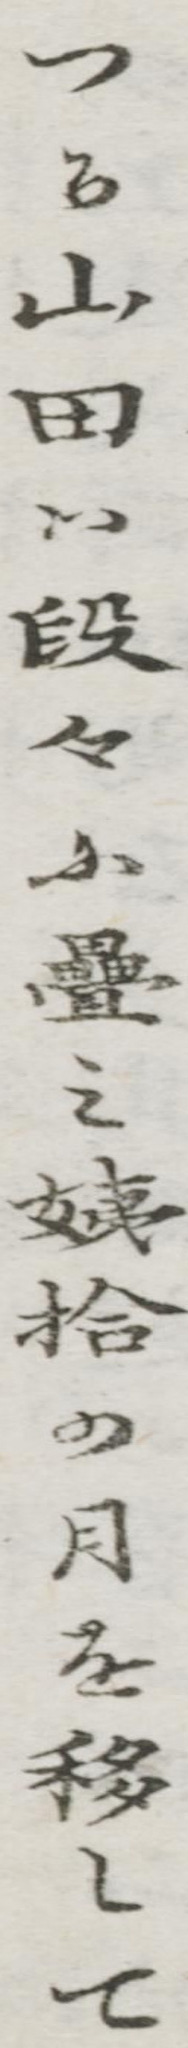つる山田は段々に畳み姨捨の月を移して
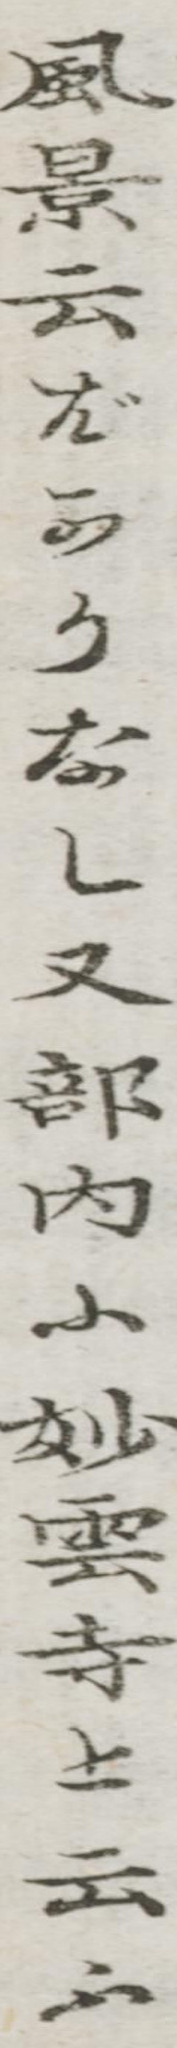風景云ばかりなし又部内に妙雲寺と云ふ

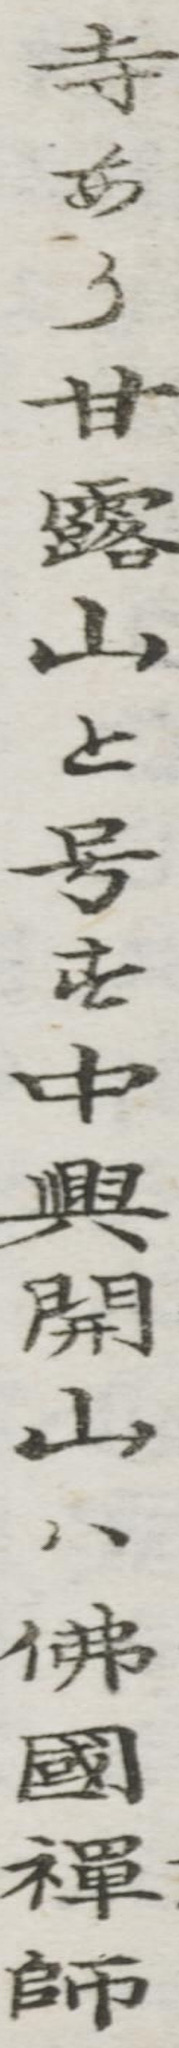寺あり甘露山と号す中興開山は佛國禅師
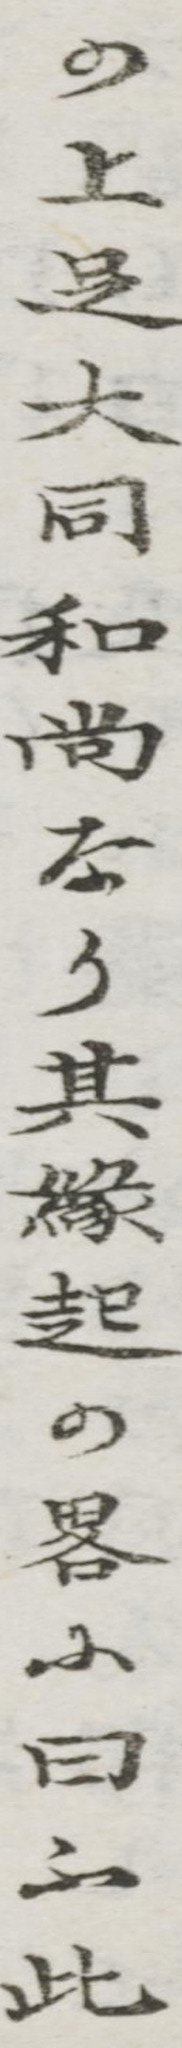の上足大同和尚なり其縁起の畧に曰ふ此
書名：塩原繁昌記　全
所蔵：東京大学地震研究所図書室 Earthquake Research Institute Library, The University of Tokyo, JAPAN
